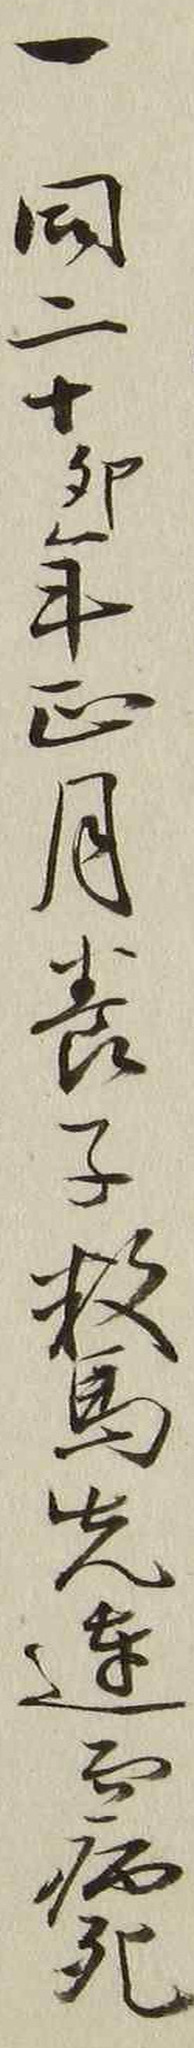一同二十卯年正月養子数馬先達而病死
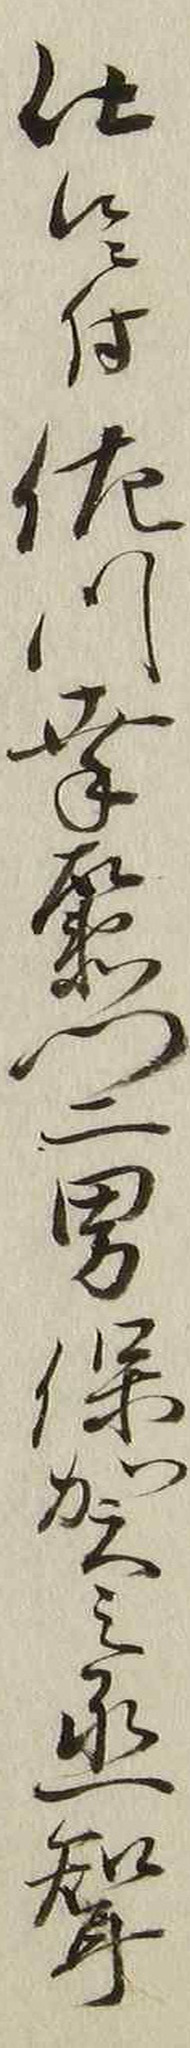仕候ニ付佐川幸左衛門二男保賀之丞聟
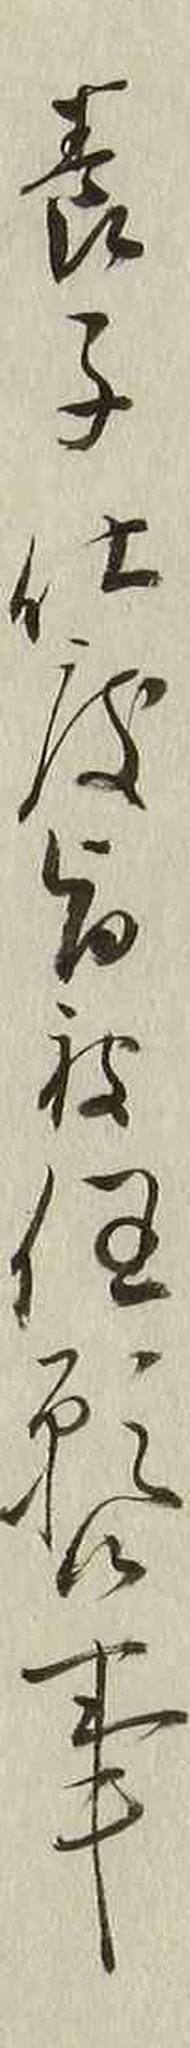養子仕度旨被任願候事
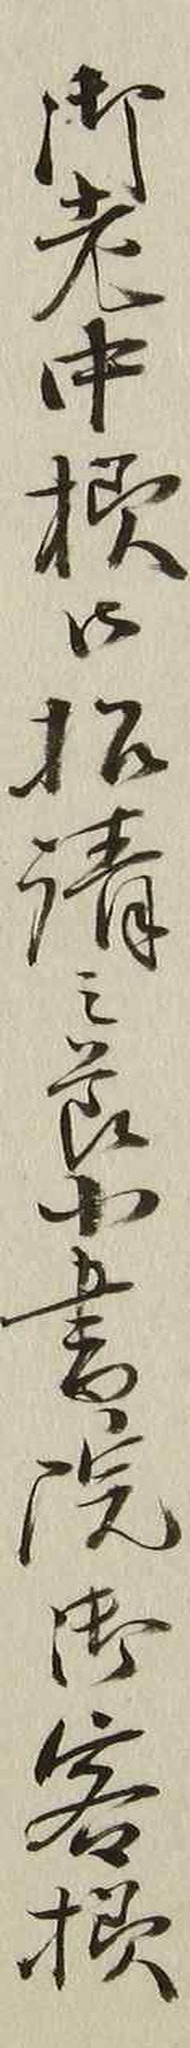御老中様御招請之節小書院御客様
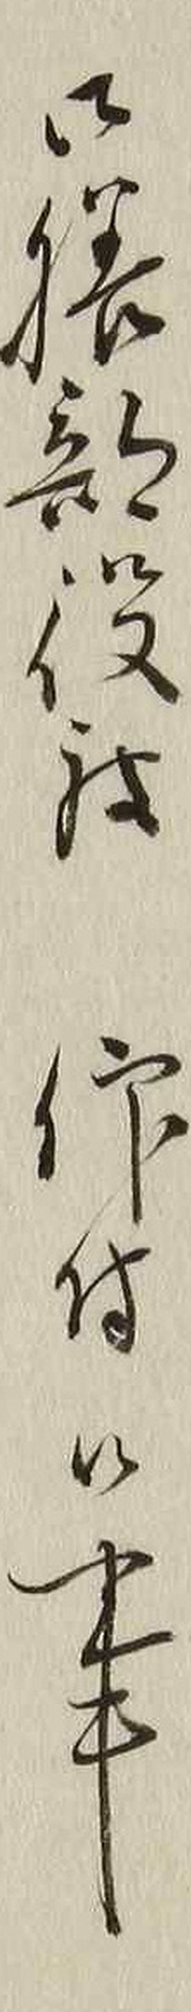御膳部役被仰付候事
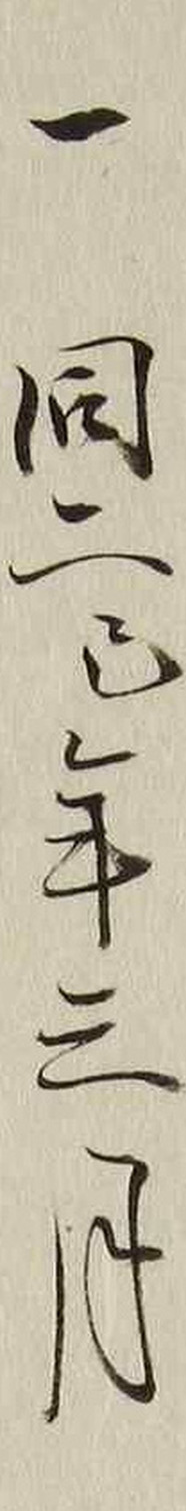一同二巳年三月
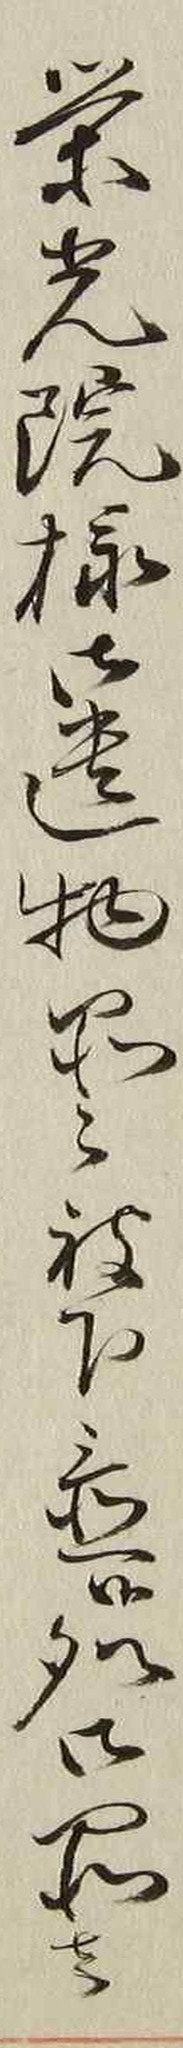栄光院様御遺物所々被下置候処御品は
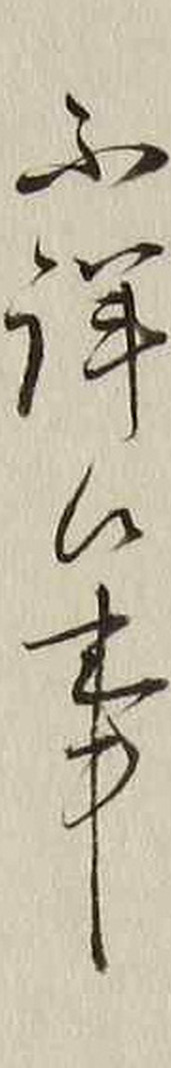不詳候事
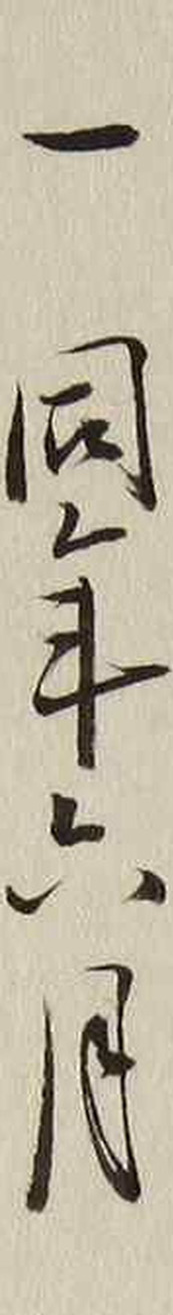一同年六月
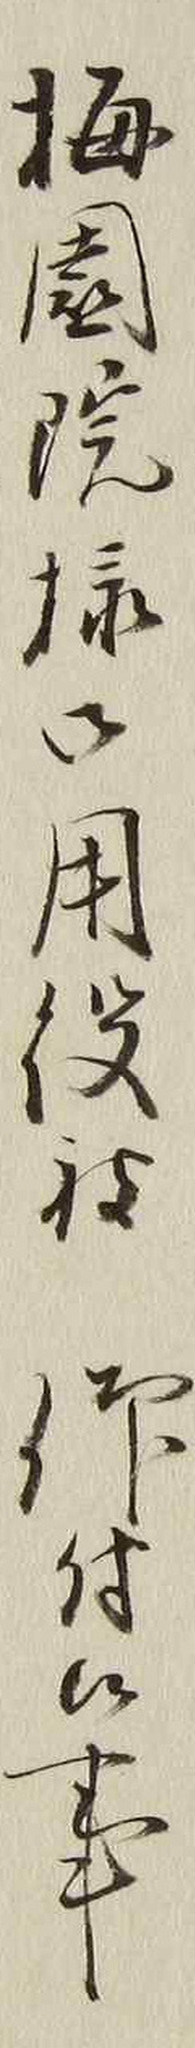梅園院様御用役被仰付候事
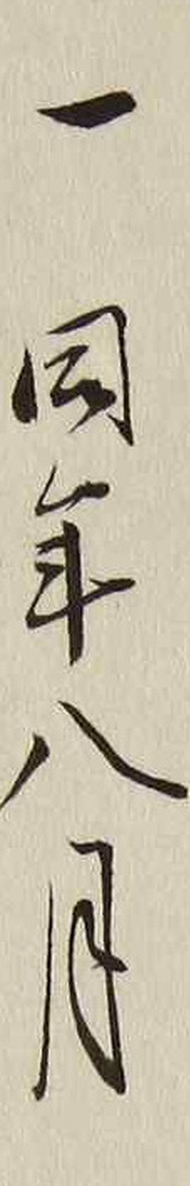一同年八月
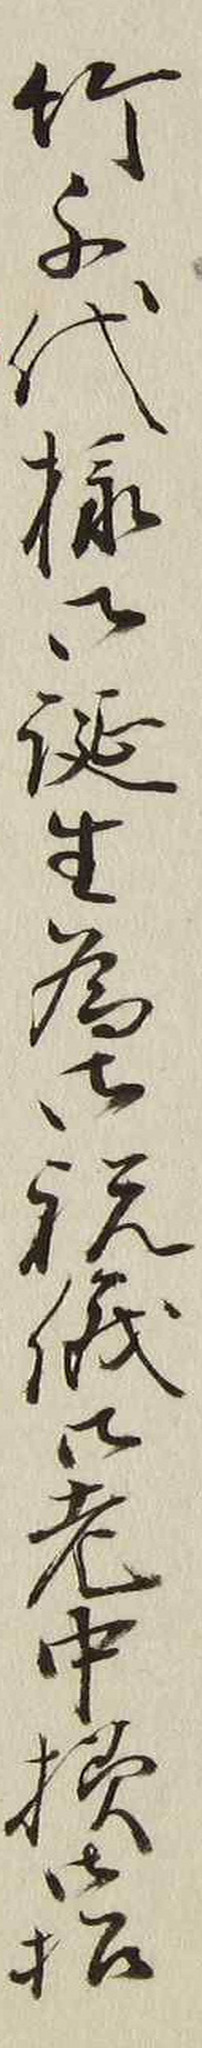竹千代様御誕生為御祝儀御老中様御招
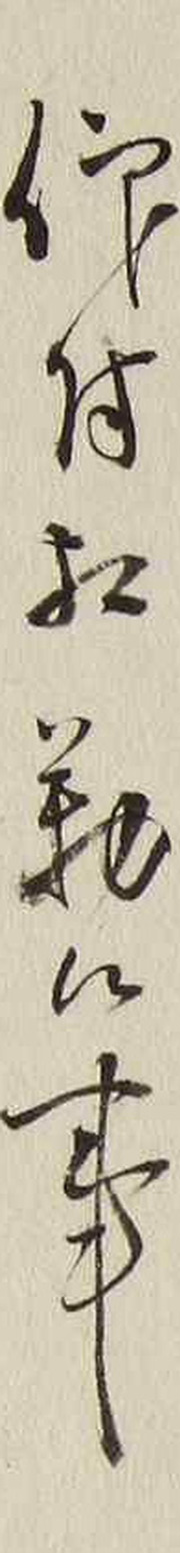仰付相勤候事
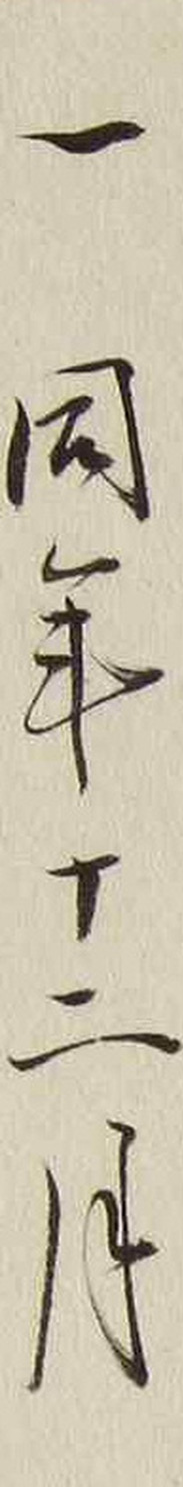一同年十二月
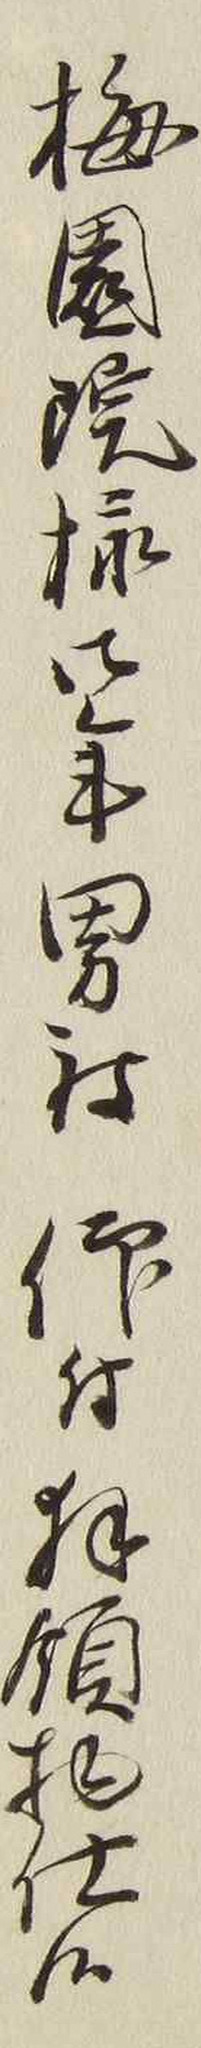梅園院様御年男被仰付拝領物仕候

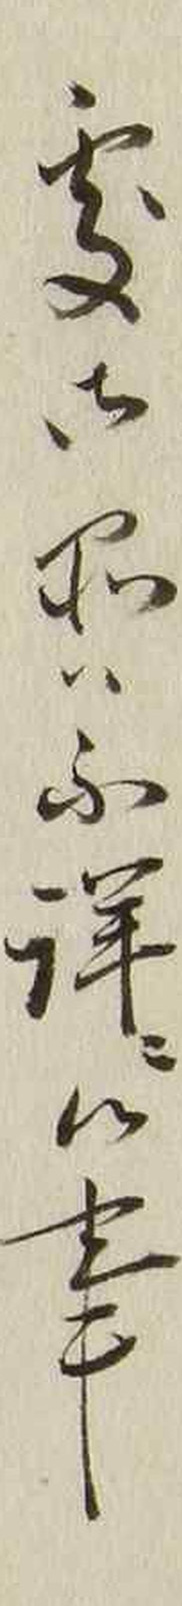処御品は不詳ニ候事
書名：諸士系譜　巻之163　な之部5
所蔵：会津若松市立会津図書館
